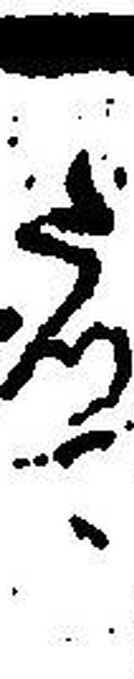たつて
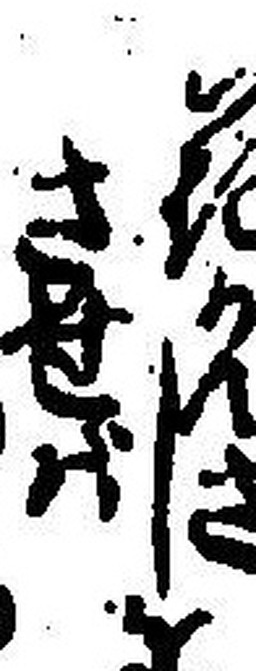させば
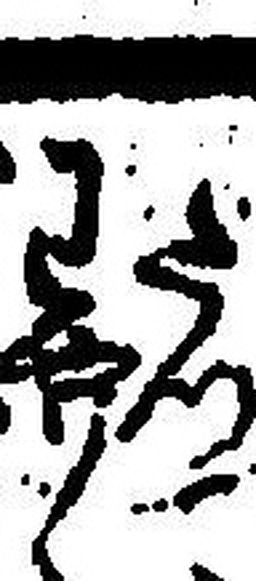わや〳〵
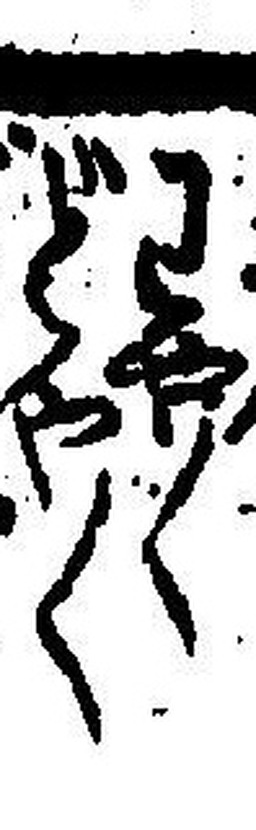どや〳〵
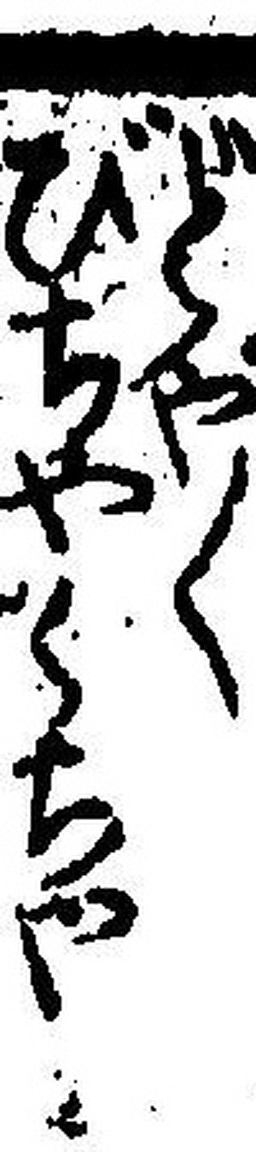びちやくちや
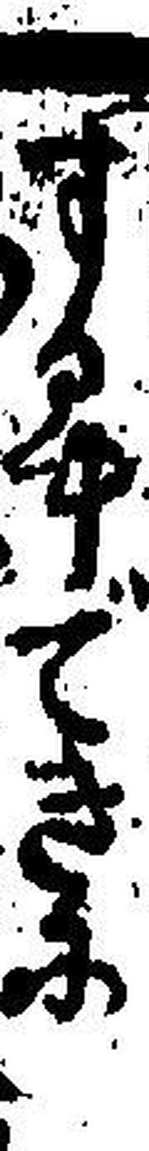する仲できに
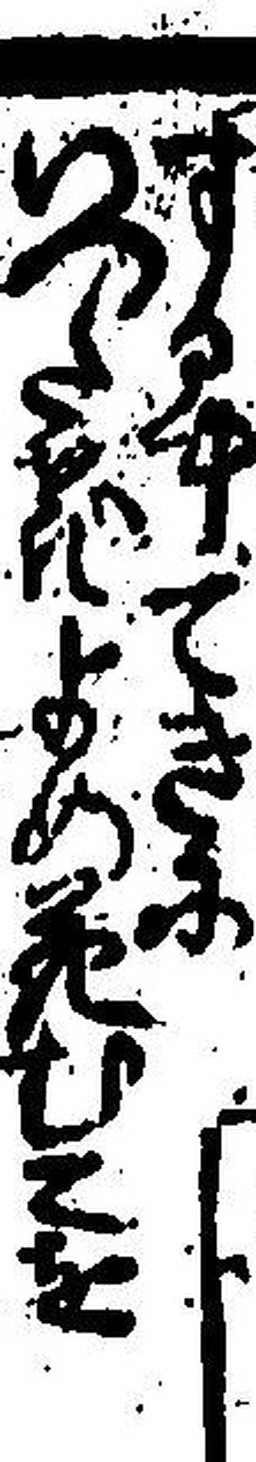いつた花よめ花むこを
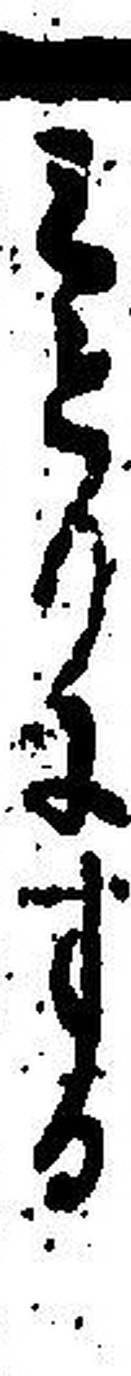みとりにする
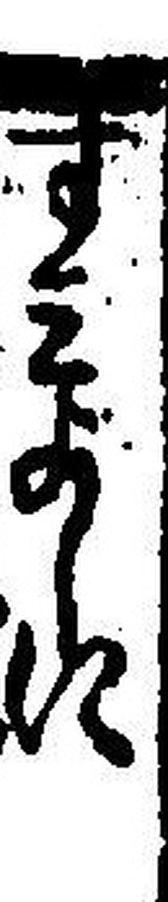すみよしに
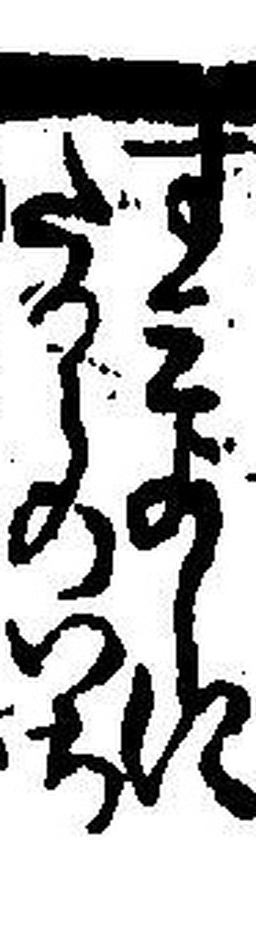たからのいち
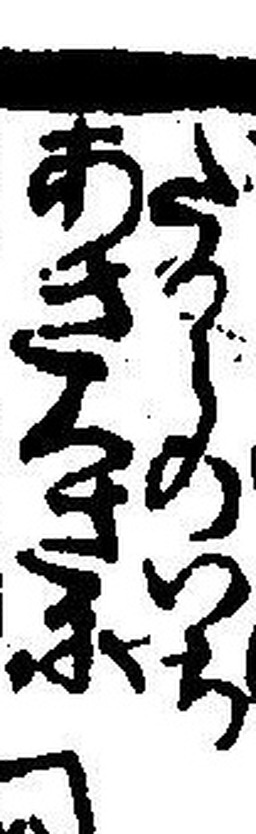あさくさに
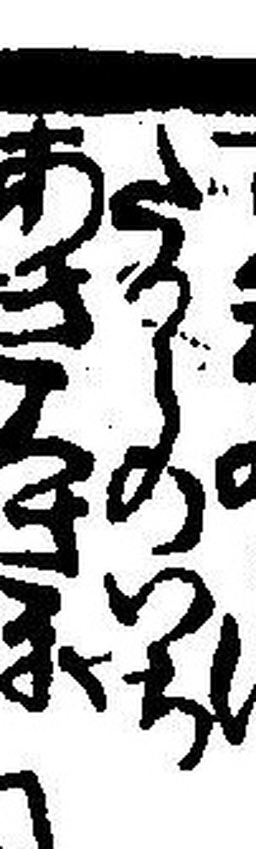あさくさに
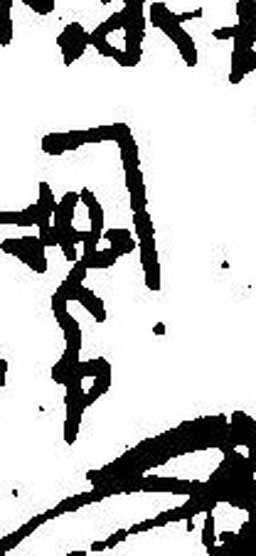〽おらァ
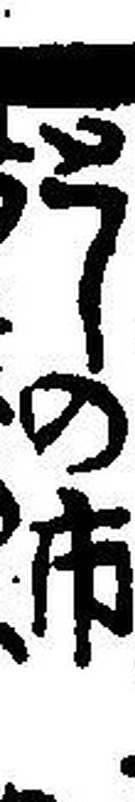としの市
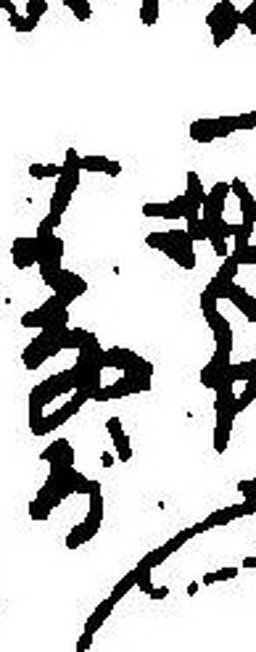はなが
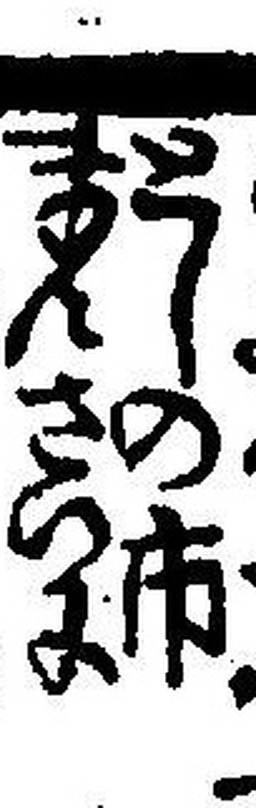まんさいに
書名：徳若水縁起金性 / 樹下石上作
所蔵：東京大学総合図書館 General Library in the University of Tokyo, JAPAN
